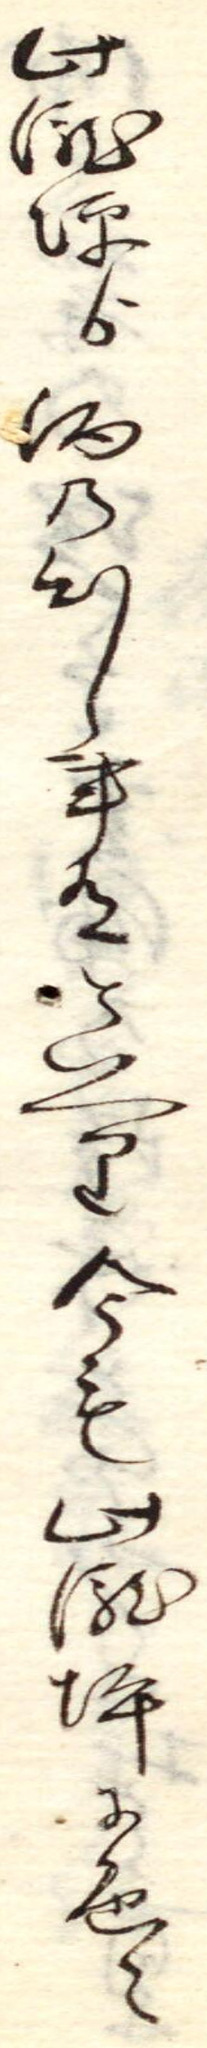此瀧坪ゟ酒の出し事有といへり今も此瀧坪に色々
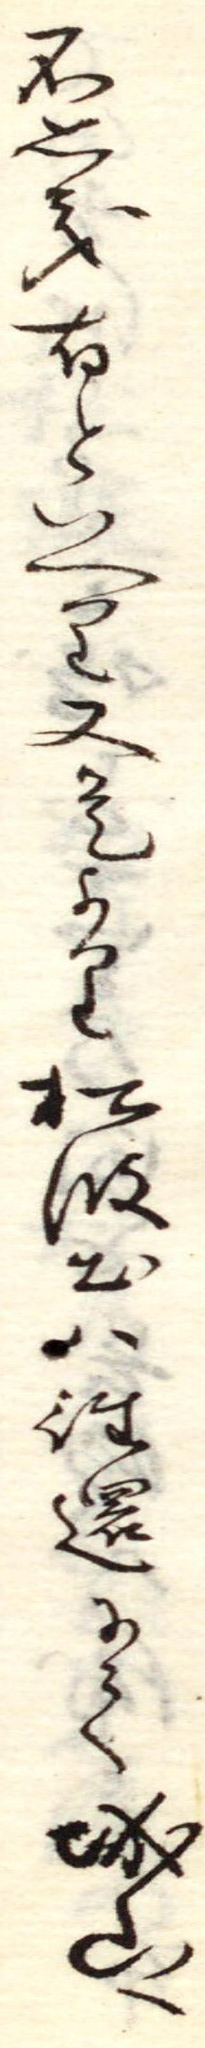不思議有といへり又是より松波出は往還にて城山へ
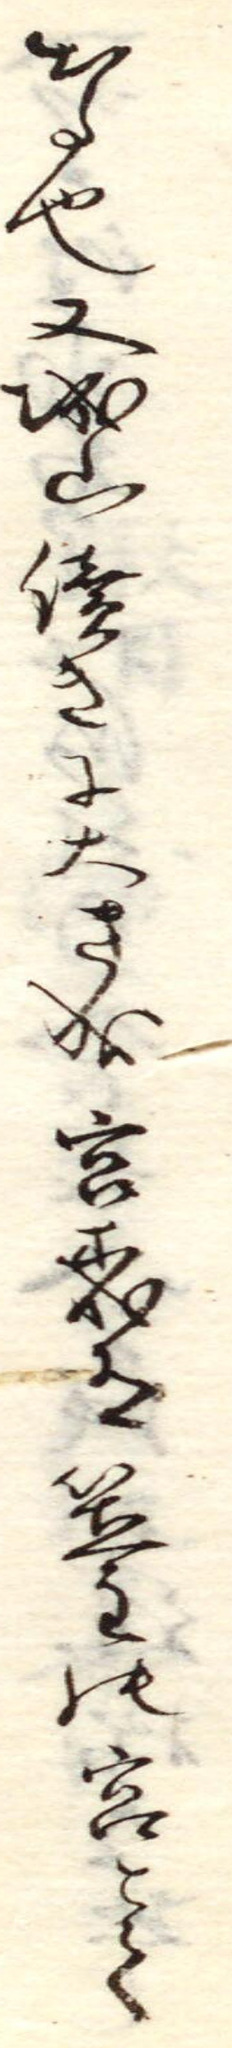出る也又城山続きに大き成宮森有笠主の宮とて
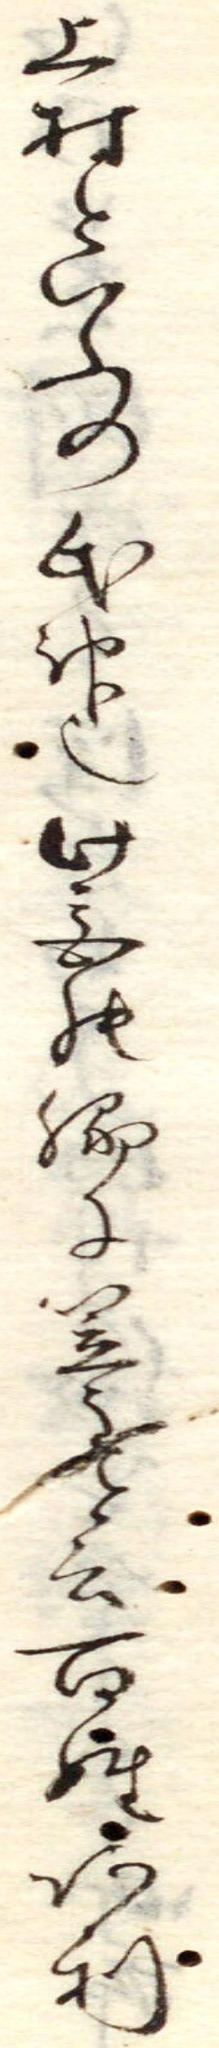上村といふの氏神也此宮の脇に笠主と云百姓あり
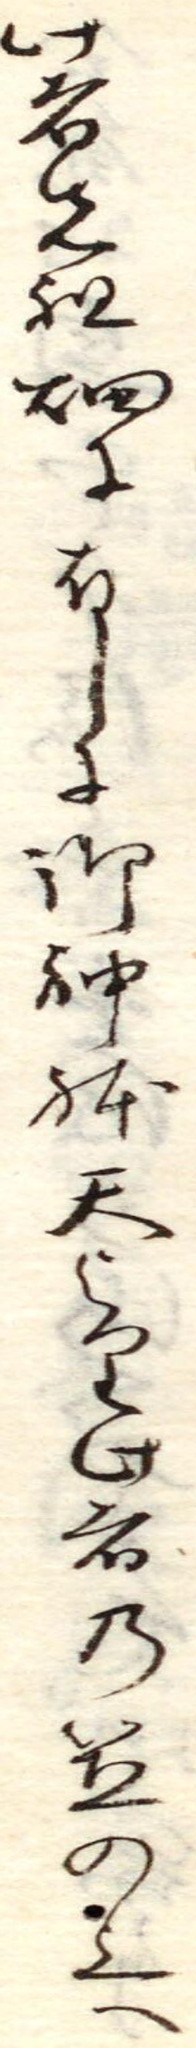此者先祖畑に有しに御神躰天より此者の笠の上へ
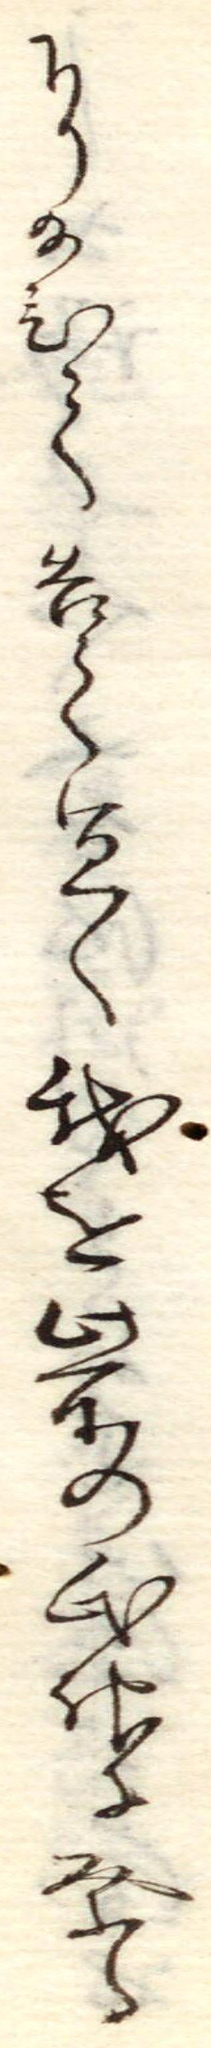下り給ひて告て宣く我を此所の氏神に祭る
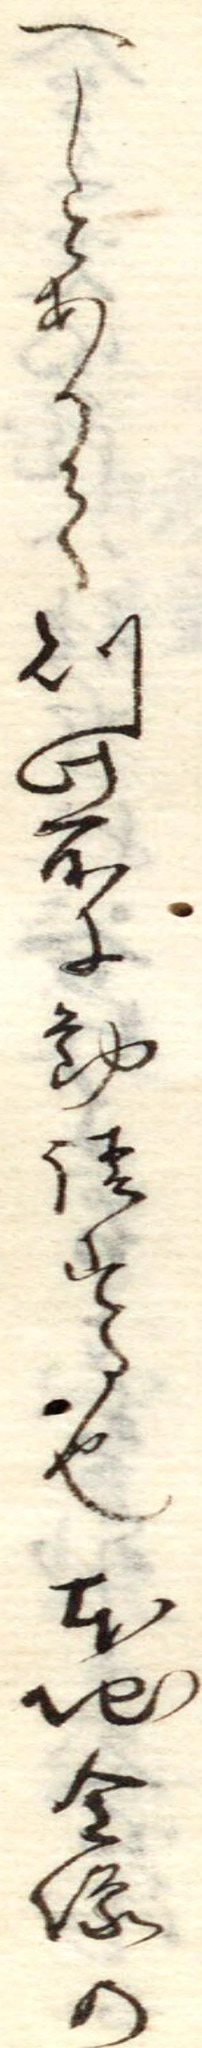へしとありて則此所に勧請する也本地金像の
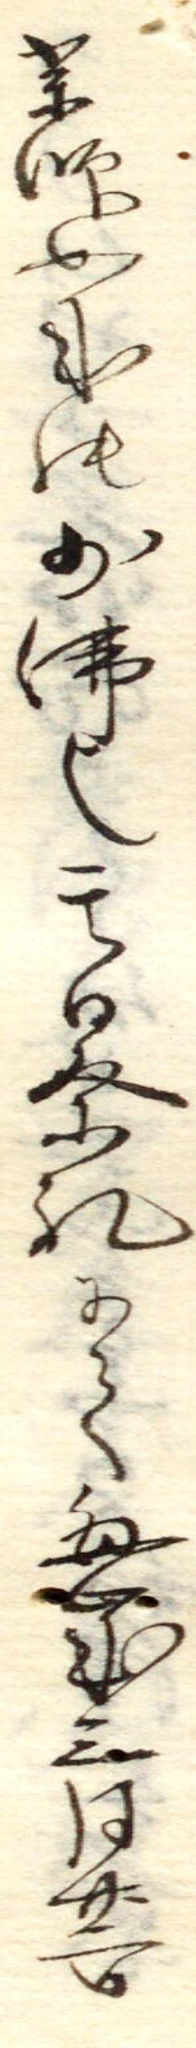薬師如来の少仏也其日祭礼にて毎歳三月廿二日

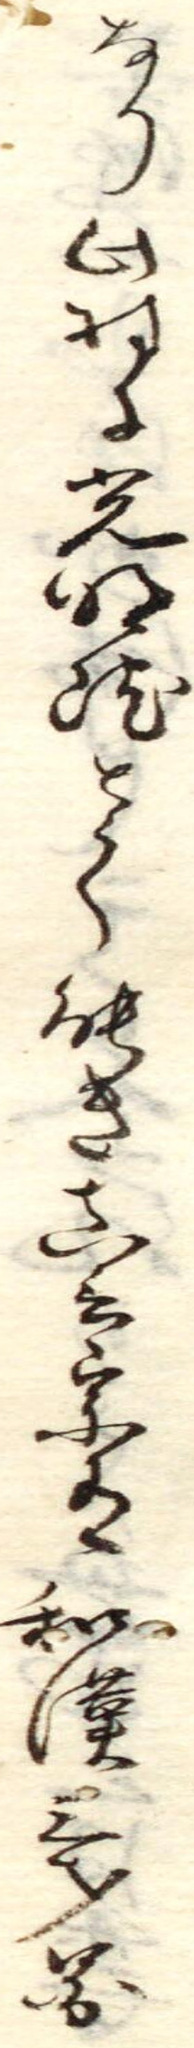なり此村に光明院とて能き真言宗有和漢三才図
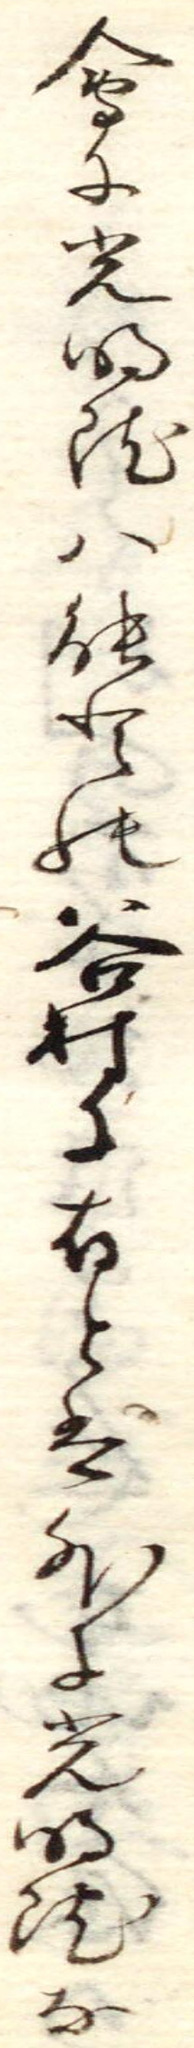会に光明院は能登の谷村に有とは外に光明院な
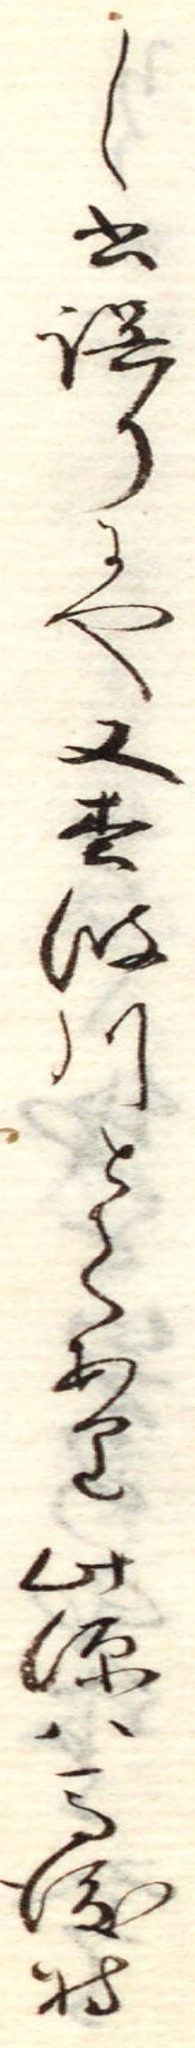し書誤りにや又枩波川とてあり此源は馬渡村
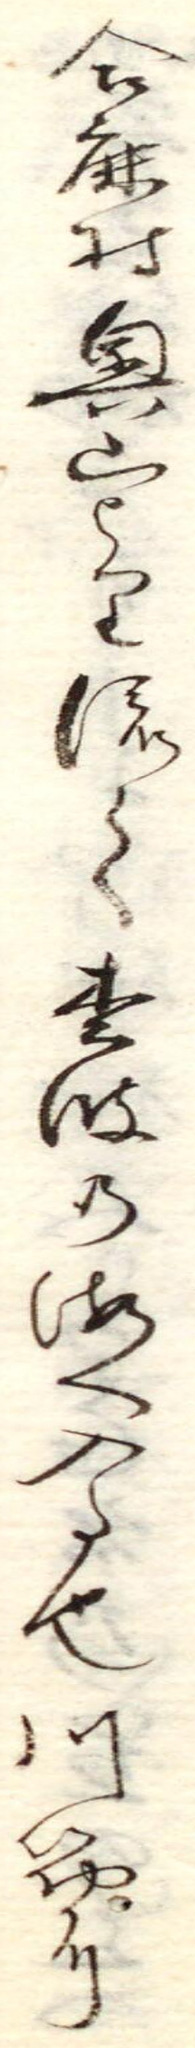合鹿村奥山より流て枩波の海へ入る也川筋に
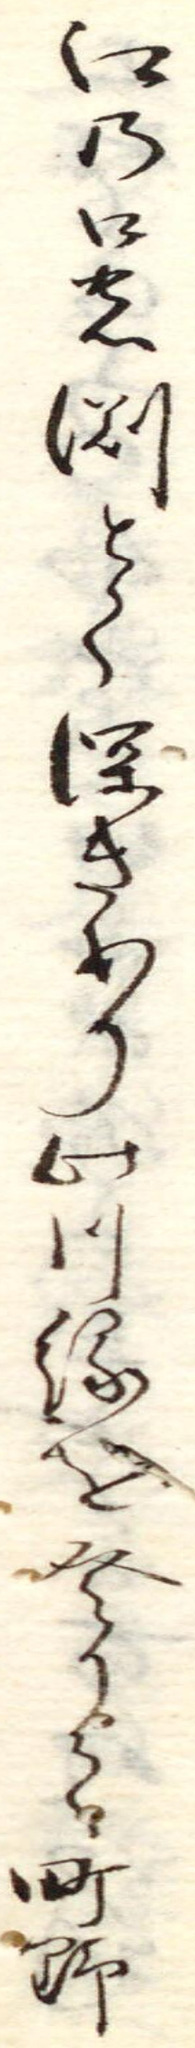郷の口の渕とて深きあり此川縁を登りて町野
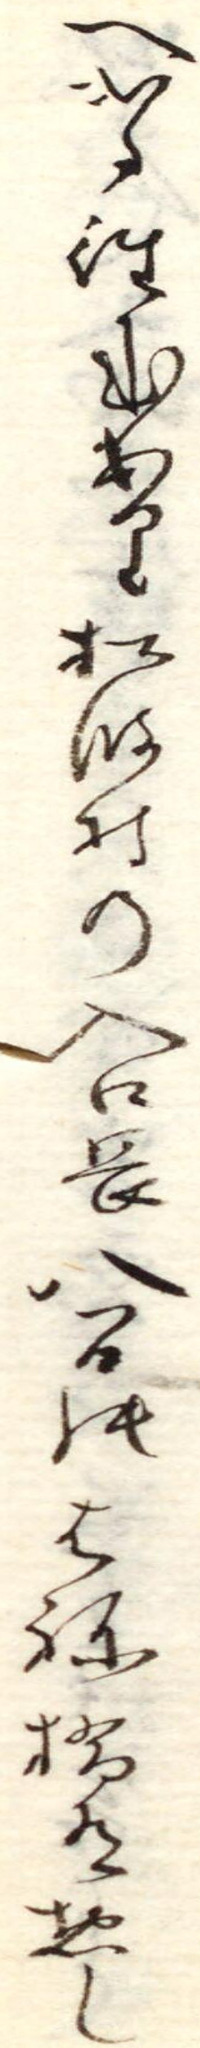へ出る往来あり松波村の入口長八間のはね橋有惣し
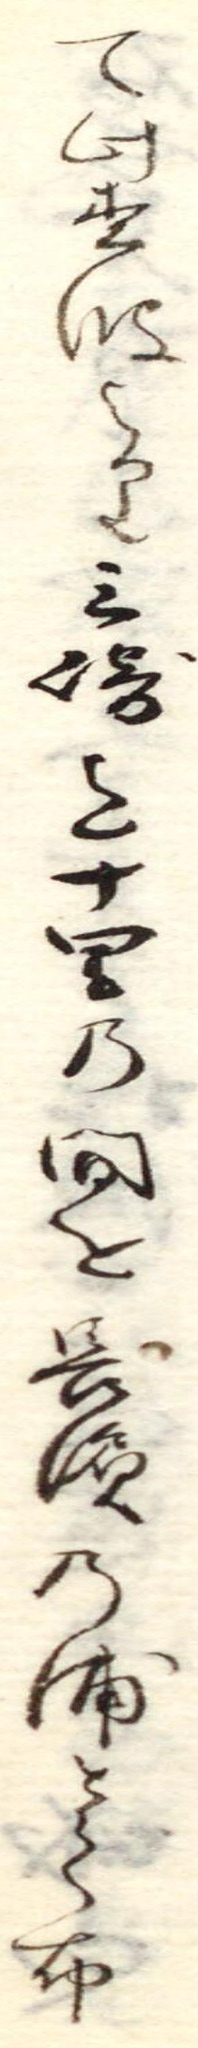て此枩波より三崎迄十里の間を長浜の浦とて布
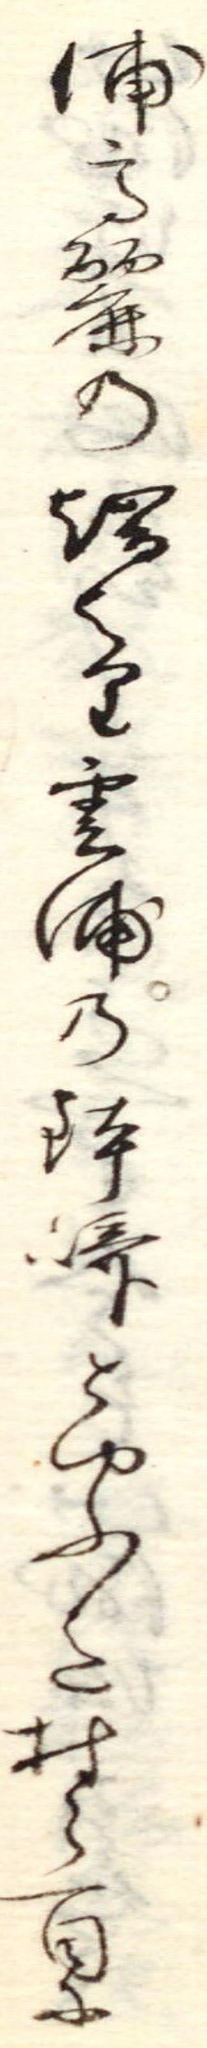浦高麗の端より雲浦の鉢崎とゆふ迄村々一目に
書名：能登名跡誌
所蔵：Ishikawa Prefectural Library
